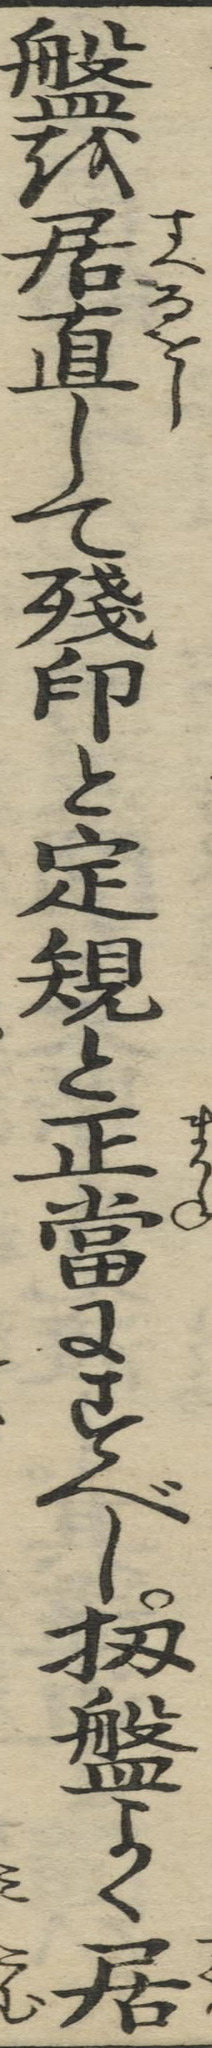盤を居直して残印と定規と正当にすべし。扨盤よく居
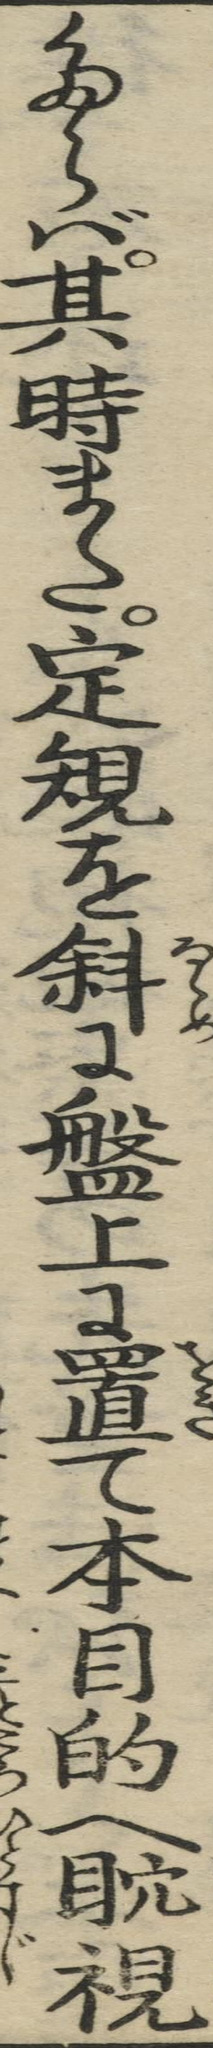たらば。其時また。定規を斜に盤上に置て本目的へ眈視
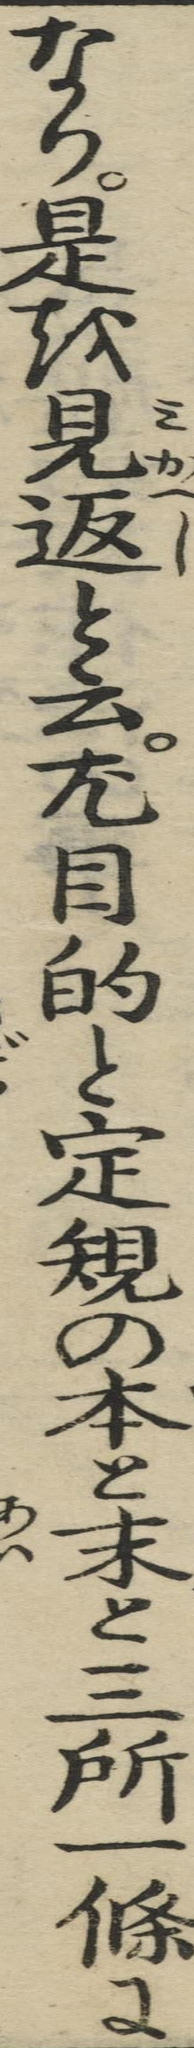なり。是を見返と云。尤目的と定規の本と末と三所一條に
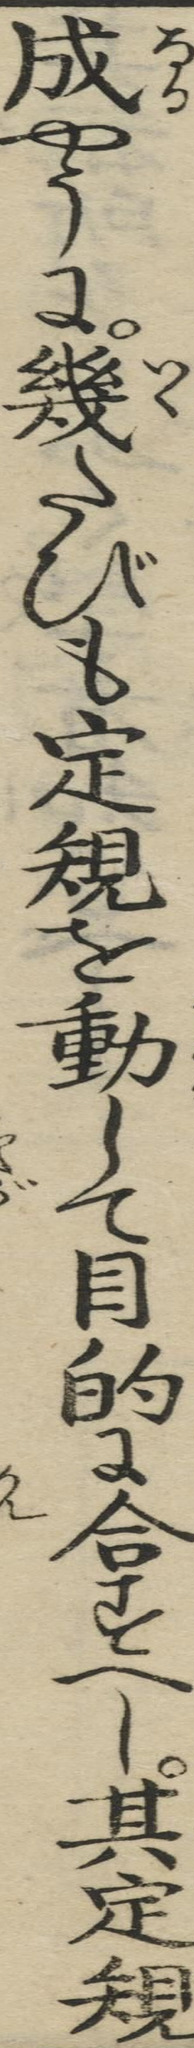成やうに。幾たびも定規を動して目的に合すへし。其定規
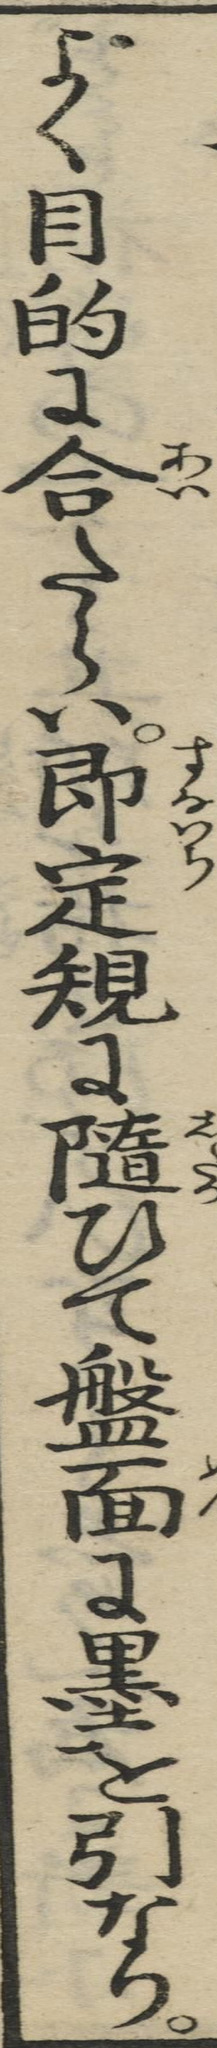よく目的に合たらは。即定規に随ひて盤面に墨を引なり。
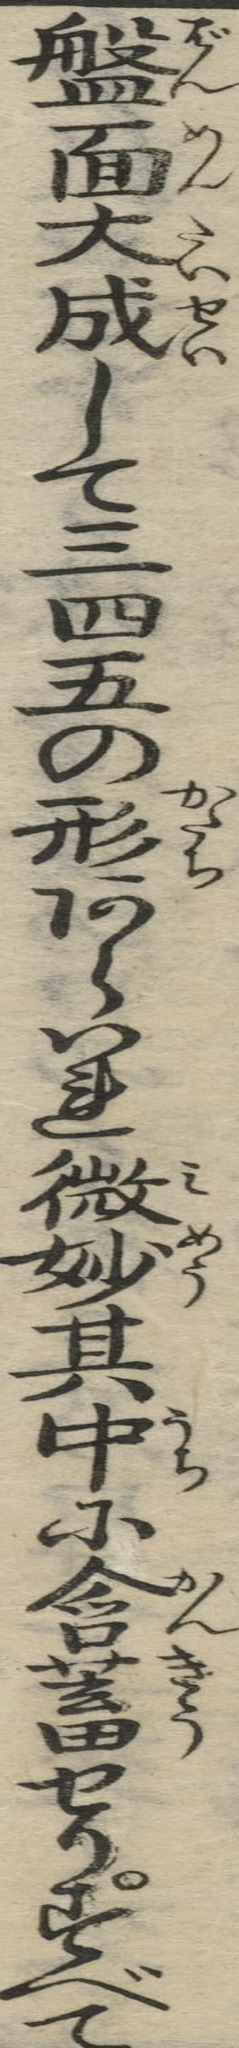盤面大成して三四五の形あらはれ微妙其中に含蓄せり。すべて
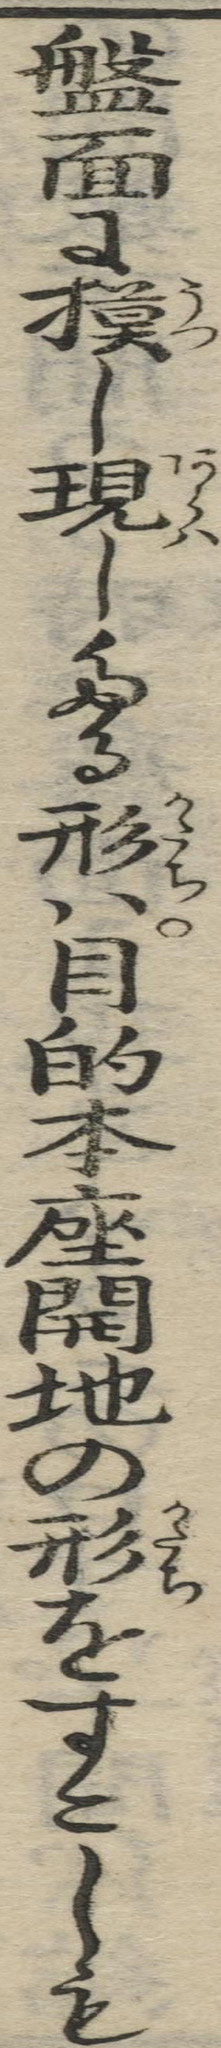盤面に模し現したる形は。目的本座開地の形をすこしも
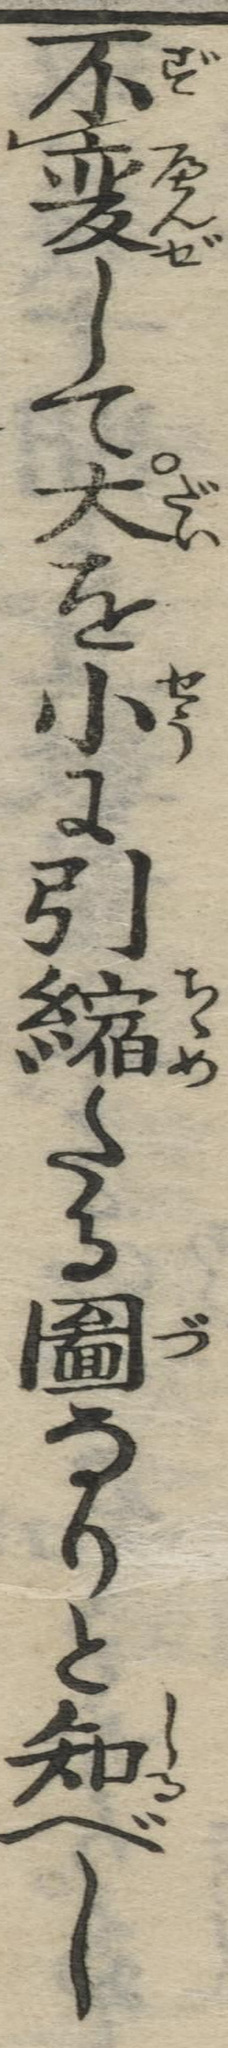不変して。大を小に引縮たる図なりと知べし
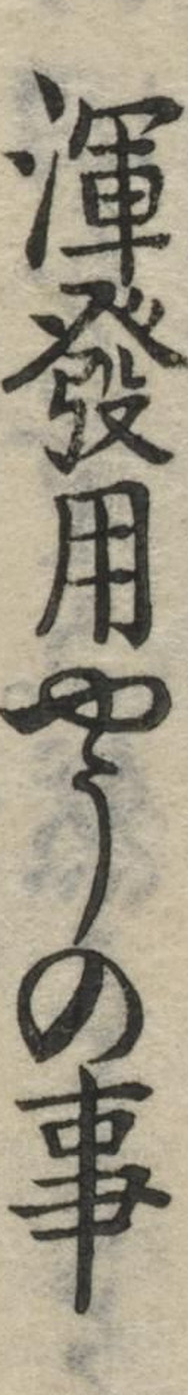渾発用やうの事
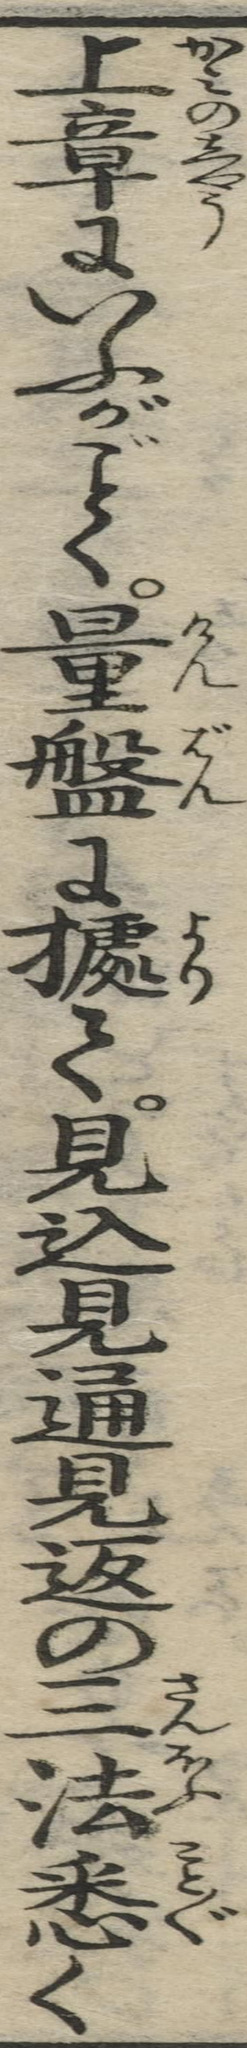上章にいふがごとく。量盤に拠て。見込見通見返の三法悉く
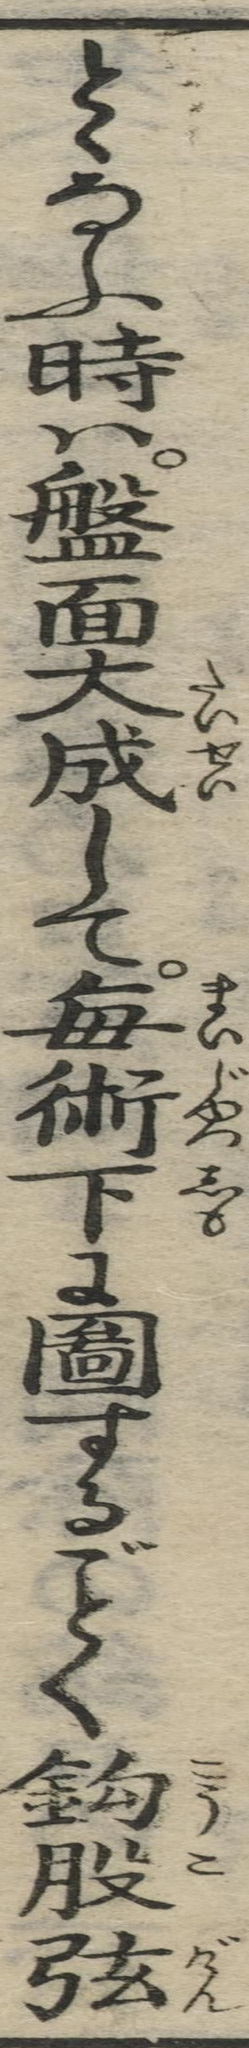とゝなふ時は。盤面大成して。毎術下に図するごとく鈎股弦

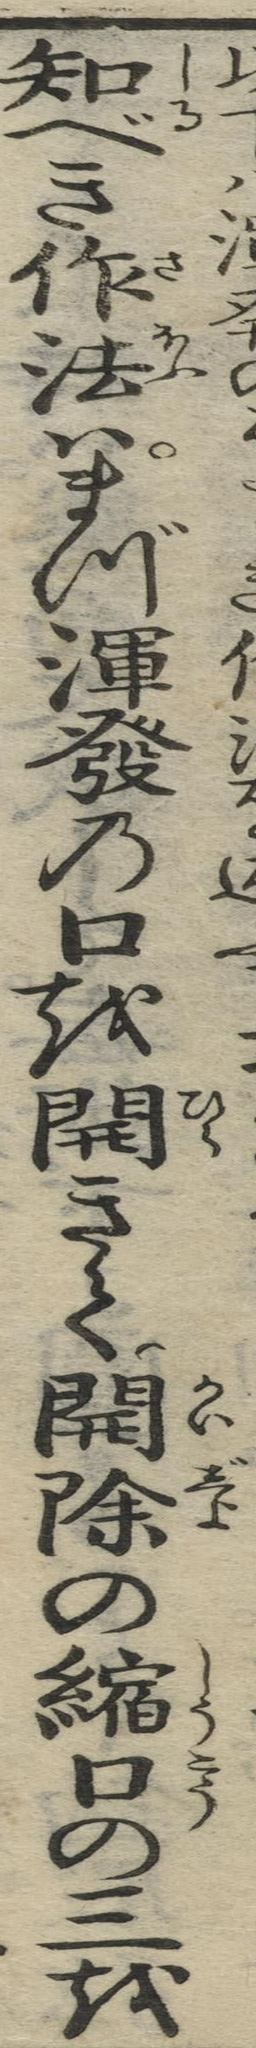知べき作法は。まづ渾発の口を開きて。開除の縮口の三を
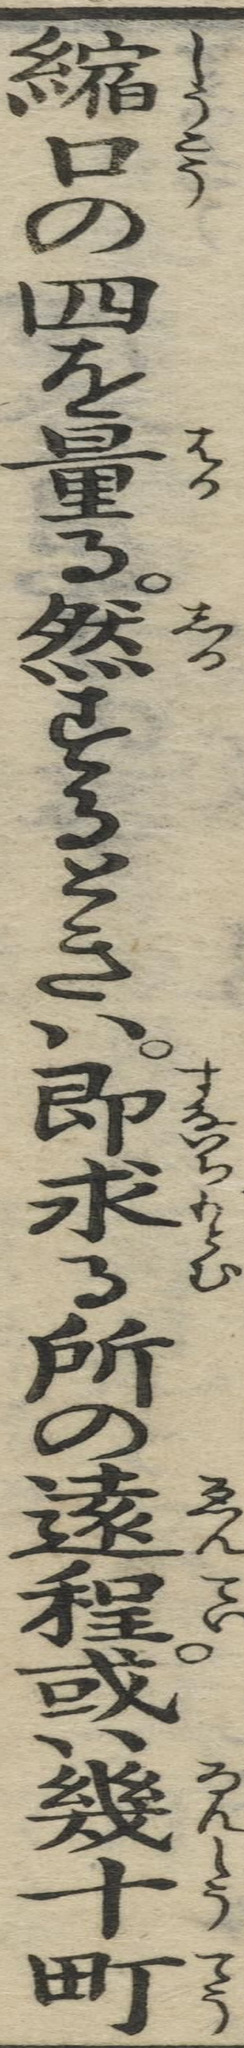縮口の四を量る。然するときは。即求むる所の遠程の
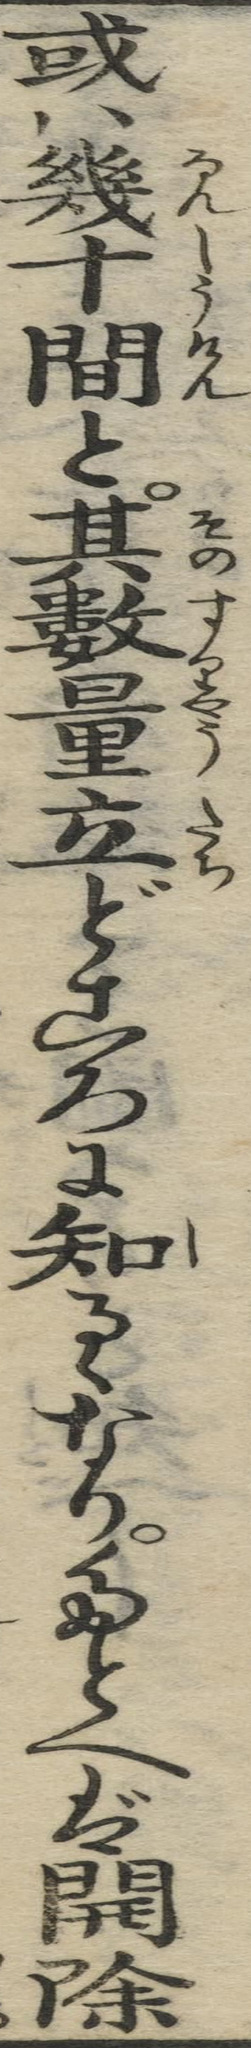或は幾十間と。其数量立どころに知るゝなり。たとへば開除
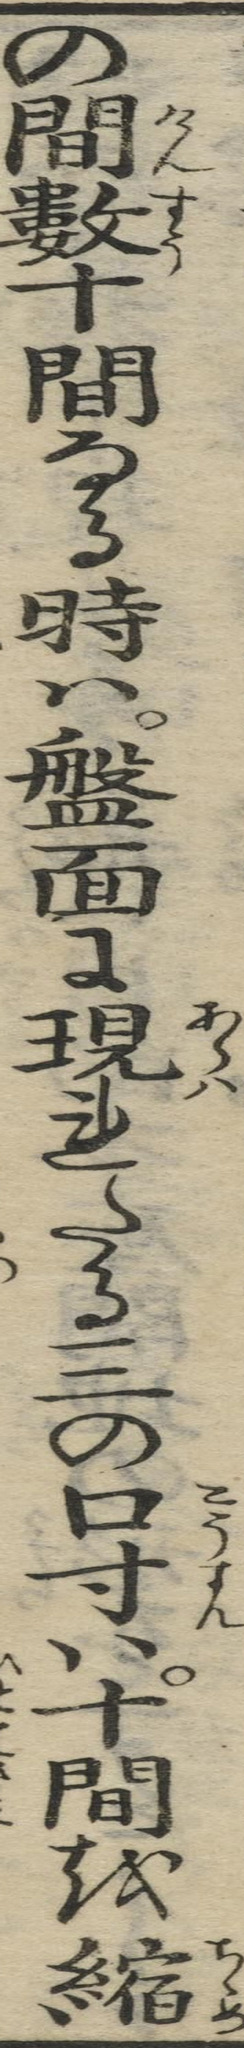の間数十間なる時は。盤面に現れたる三の口寸は。十間を縮
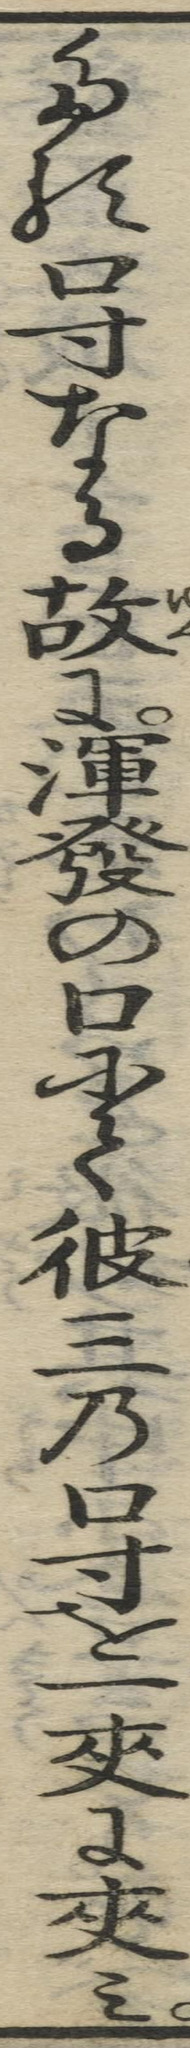たる口寸なる故に。渾発の口にて彼三の口寸を一夾に夾み。
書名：量地指南　巻之一（内題）
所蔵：東京大学地震研究所図書室 Earthquake Research Institute Library, The University of Tokyo, JAPAN
